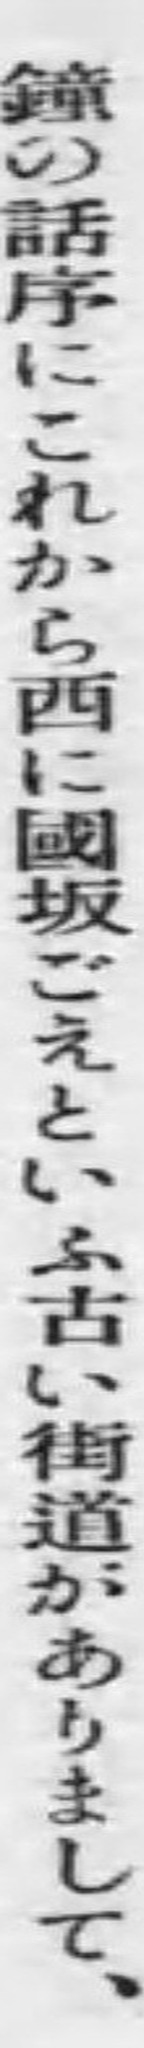鐘の話序にこれから西に国坂ごえといふ古い街道がありまして、
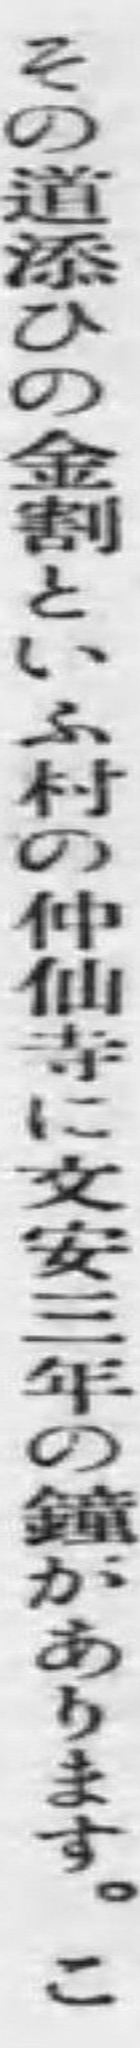その道添ひの金割といふ村の仲仙寺に文安三年の鐘があります。こ
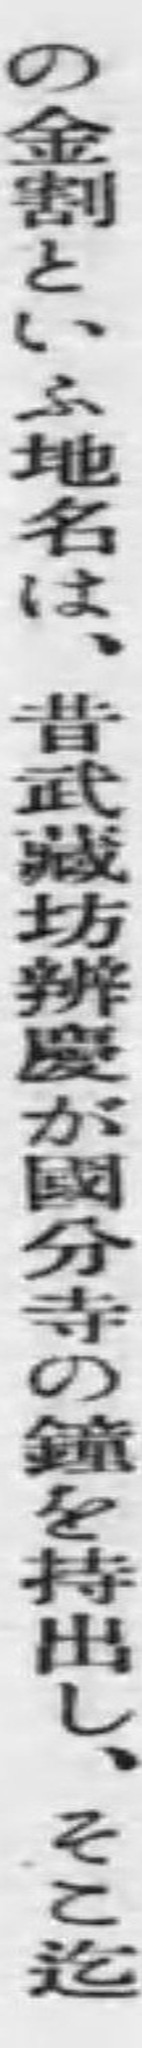の金割といふ地名は、昔武蔵坊弁慶が国分寺の鐘を持出し、そこ迄
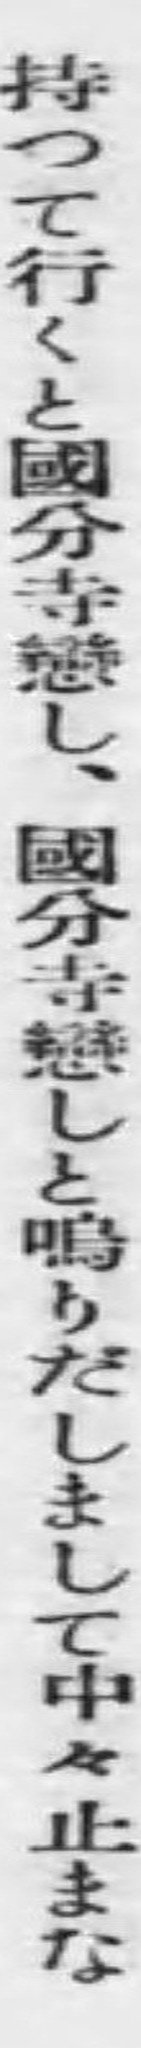持つて行くと国分寺恋し、国分寺恋しと鳴りだしまして中々止まな
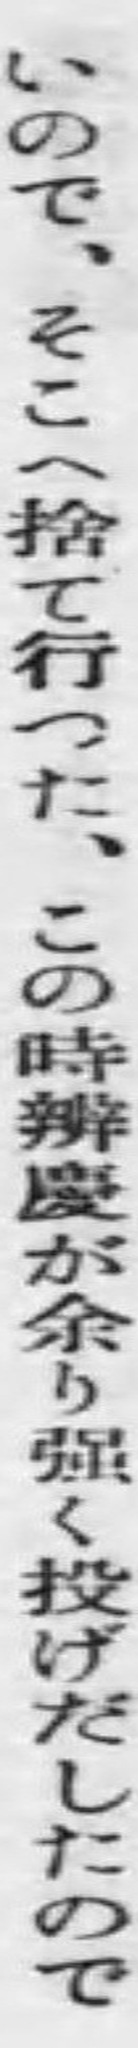いので、そこへ捨て行つた、この時弁慶が余り強く投げだしたので
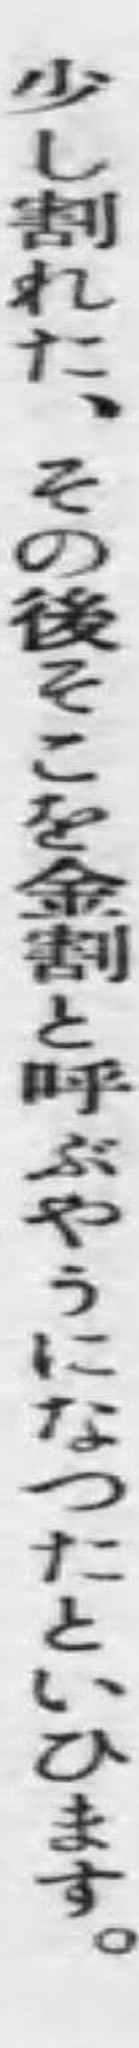少し割れた、その後そこを金割と呼ぶやうになつたといひます。
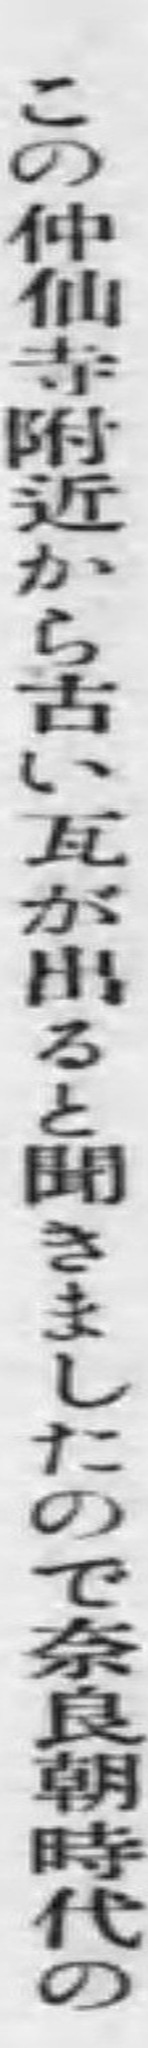この仲仙寺附近から古い瓦が出ると聞きましたので奈良朝時代の
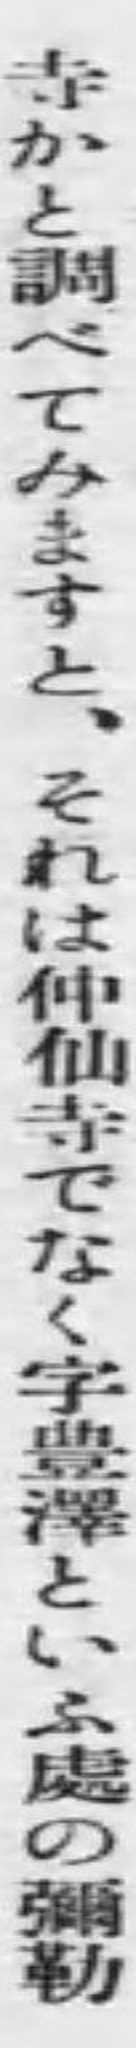寺かと調べてみますと、それは仲仙寺でなく字豊沢といふ処の弥勒
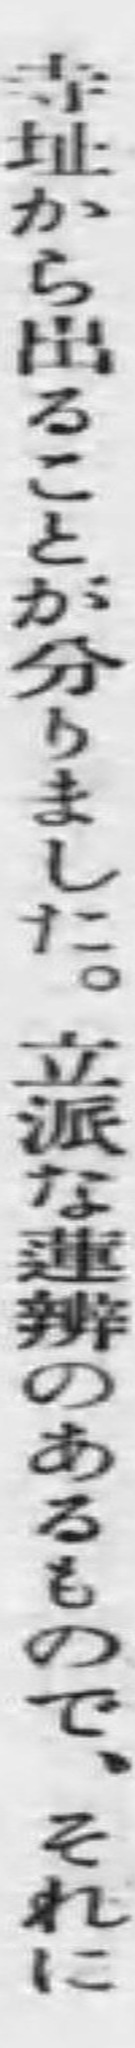寺址から出ることが分りました。立派な蓮弁のあるもので、それに
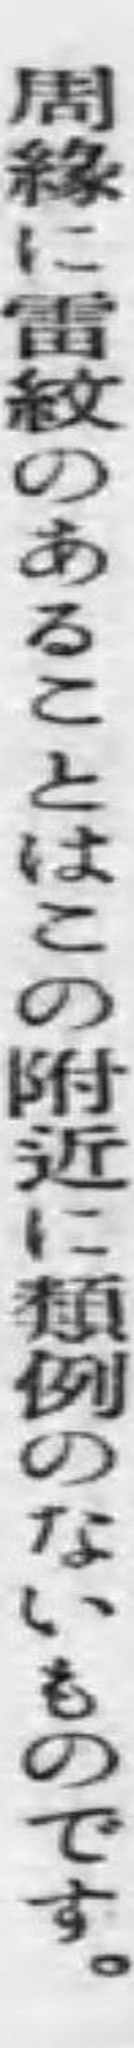周縁に雷紋のあることはこの附近に類例のないものです。
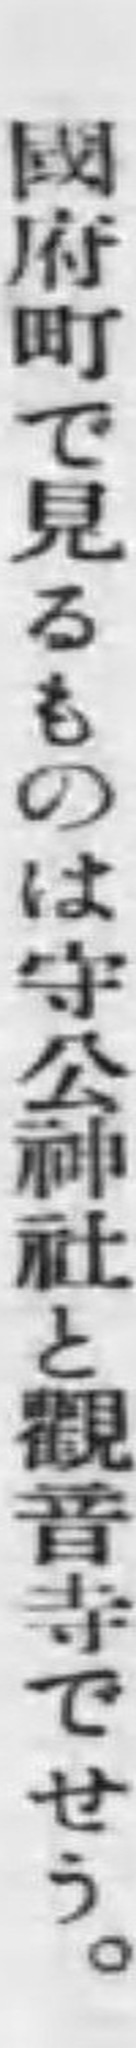国府町で見るものは守公神社と観音寺でせう。
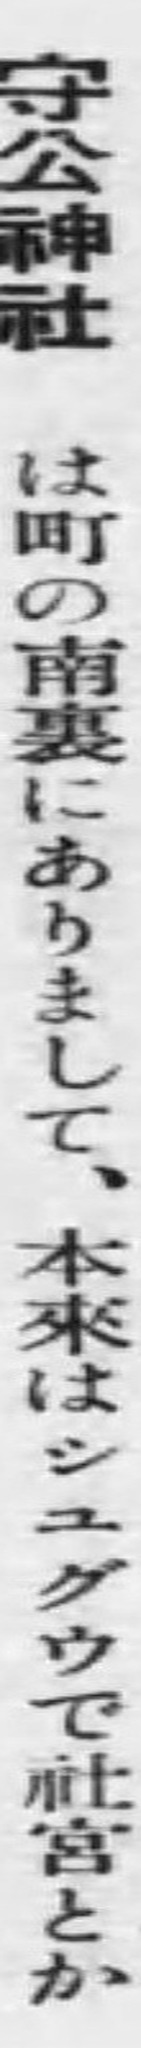守公神社は町の南裏にありまして、本来はシユグウで社宮とか
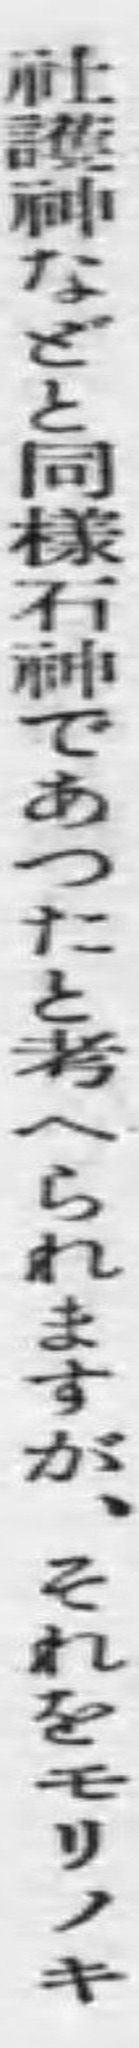社護神などと同様石神であつたと考へられますが、それをモリノキ
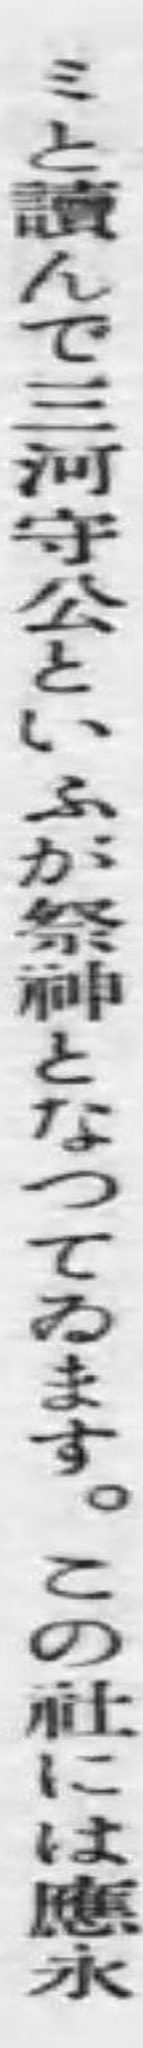ミと読んで三河守公といふが祭神となつてゐます。この社には応永
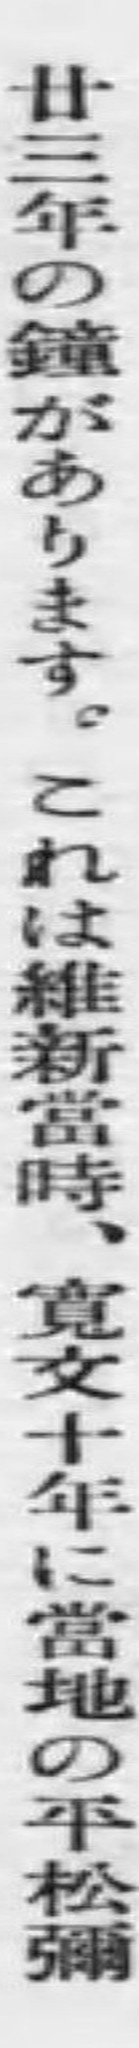廿三年の鐘があります。これは維新当時、寛文十年に当地の平松弥
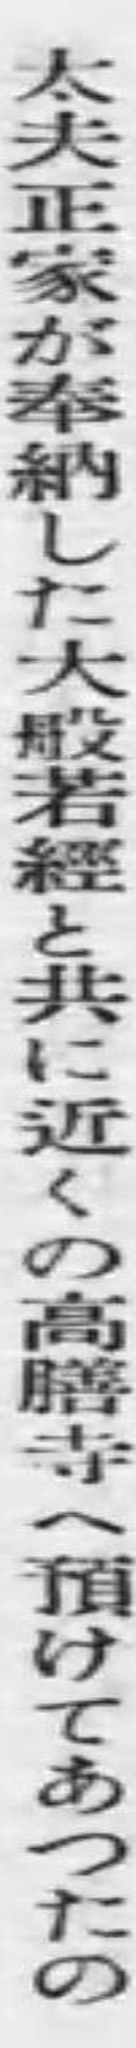太夫正家が奉納した大般若経と共に近くの高膳寺へ預けてあつたの
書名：東三河道中記 : 豊橋市及其附近案内
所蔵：国立国会図書館 National Diet Library, JAPAN
